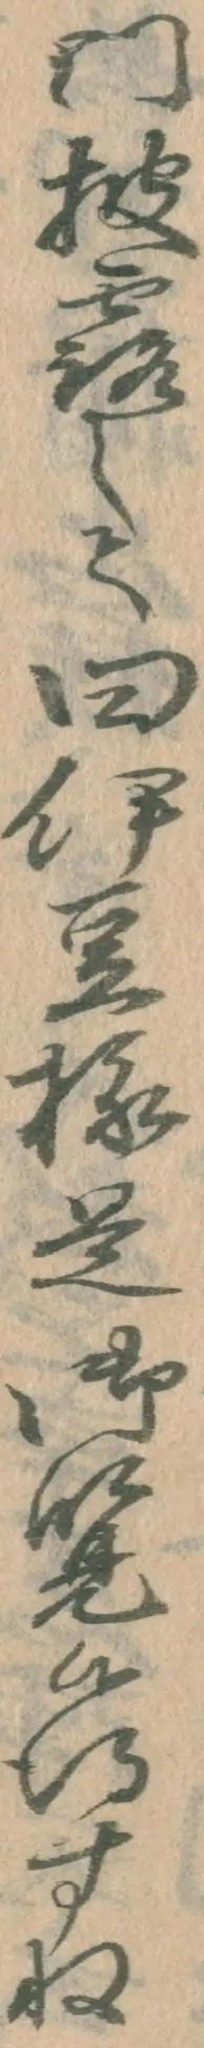門披露して曰伊豆守様是御覧候得すね
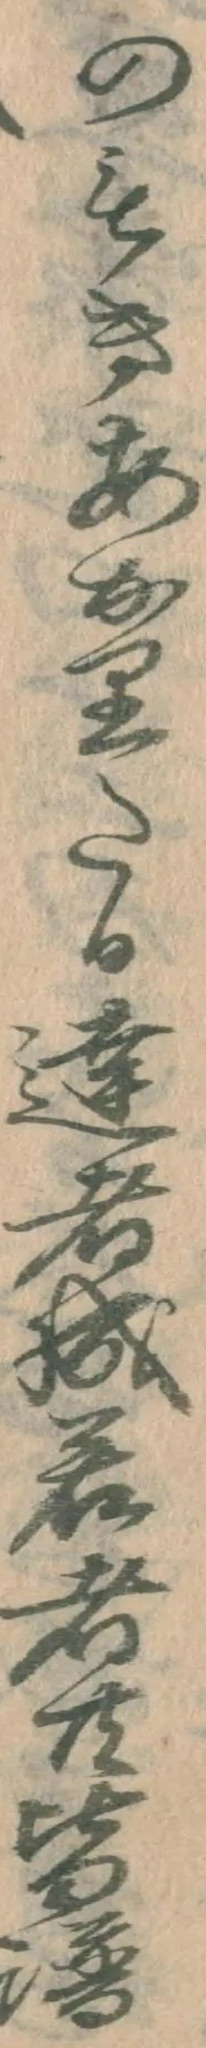のもきあか里たる達者成若者共皆譜
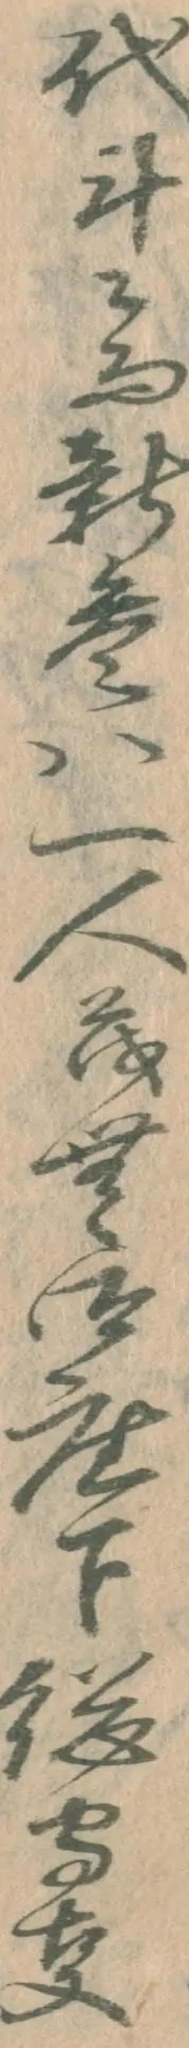代斗に而新参は一人茂無御座下従守事
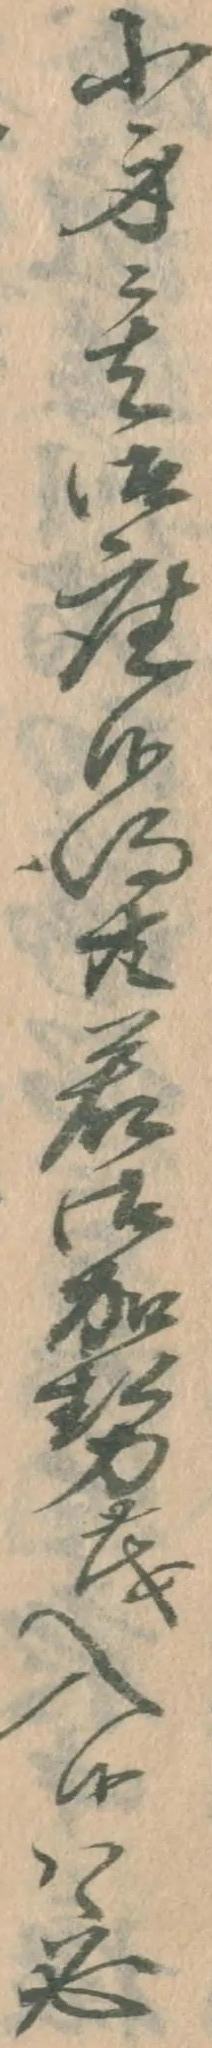小身に者御座候得共若御加勢茂入候はゝ必

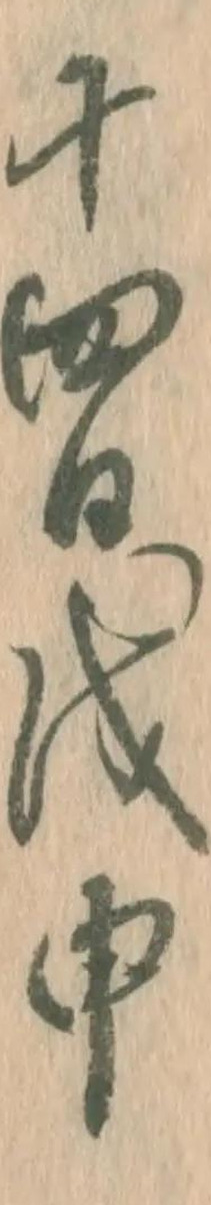十四日戌申
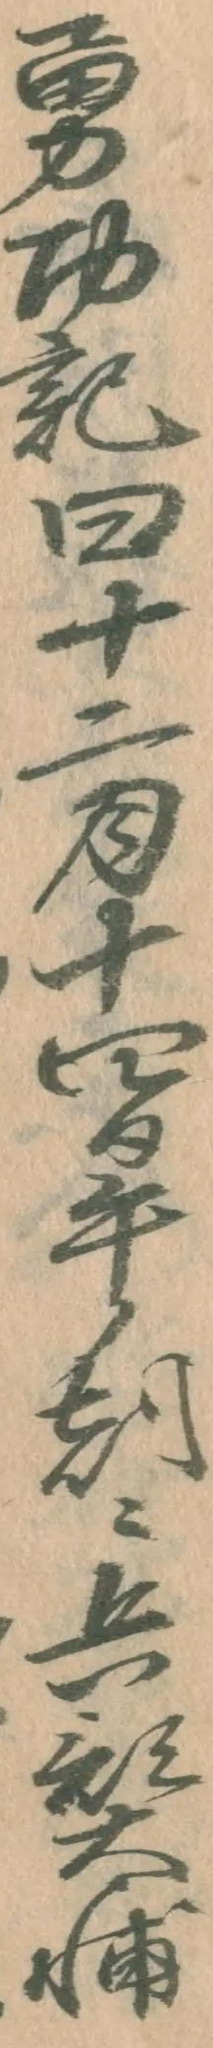勇功記曰十二月十四日午之刻に兵部大輔
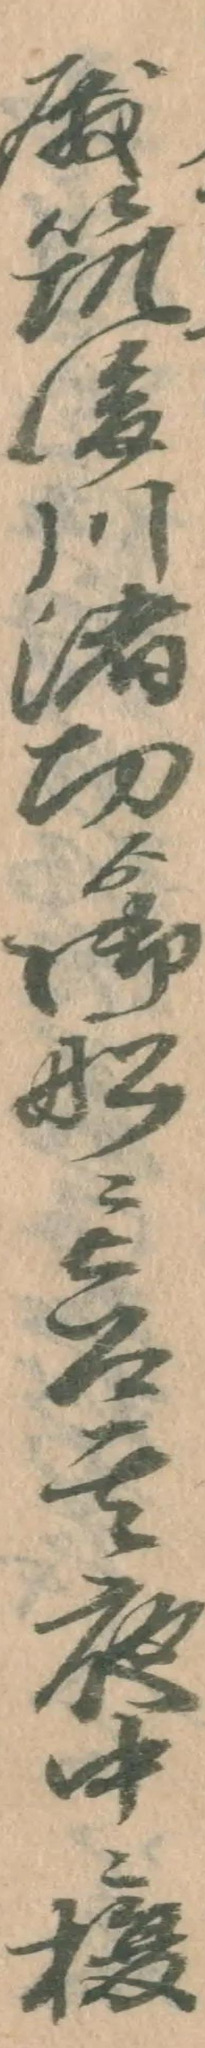殿筑後川渚切ゟ御舩に被召其夜中に摂
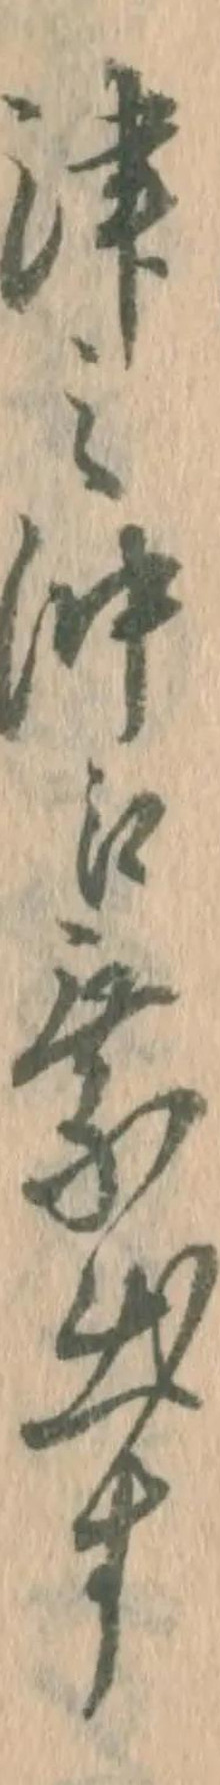津之沖江乗出す
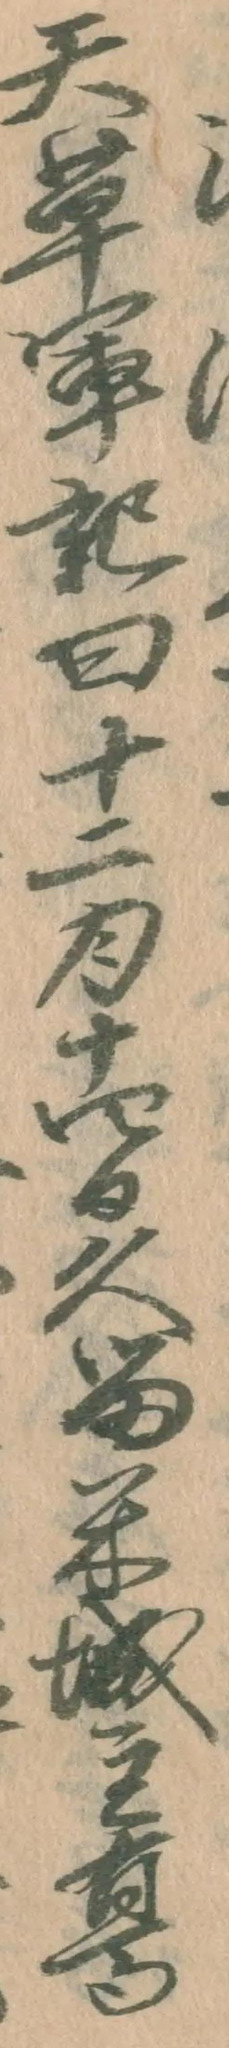天草軍記曰十二月十四日久留米城主有馬
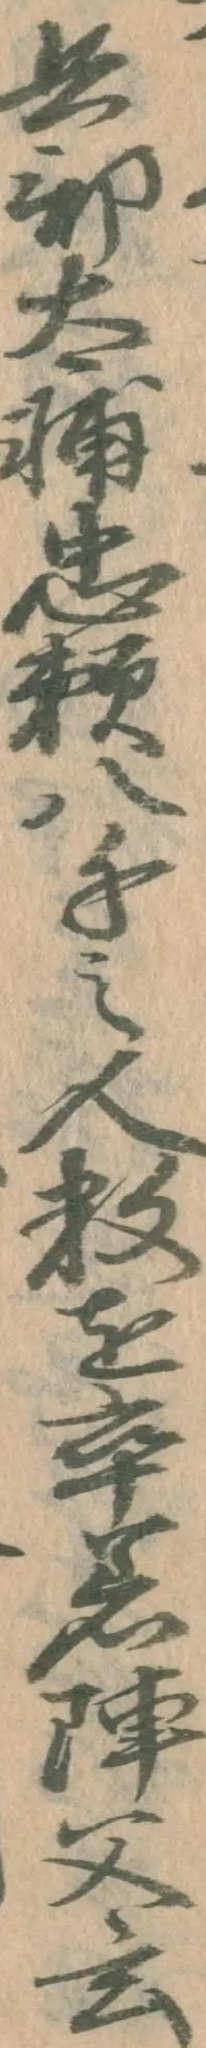兵部太輔忠頼八千之人数を卒着陣父玄
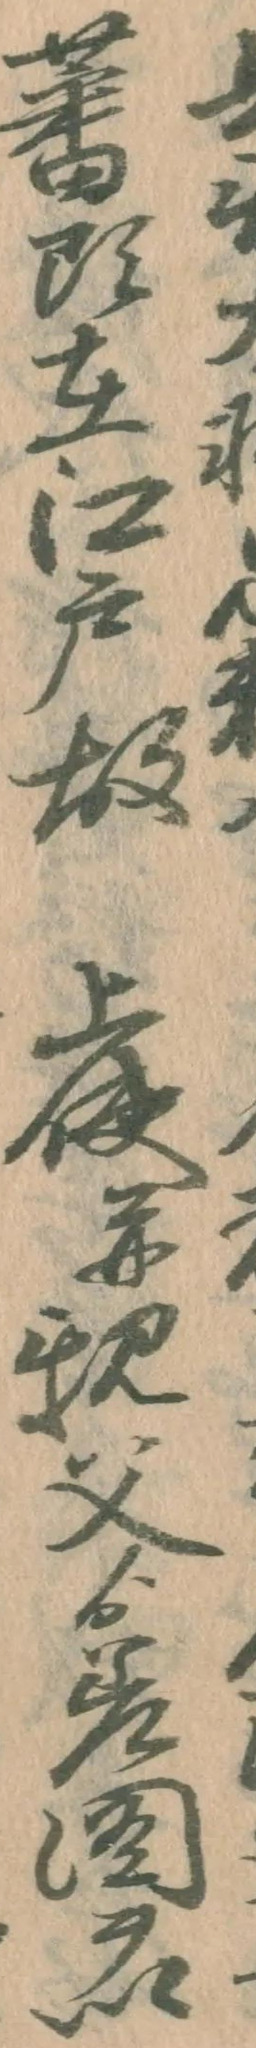蕃頭在江戸故上使幷親父ゟ差図を以
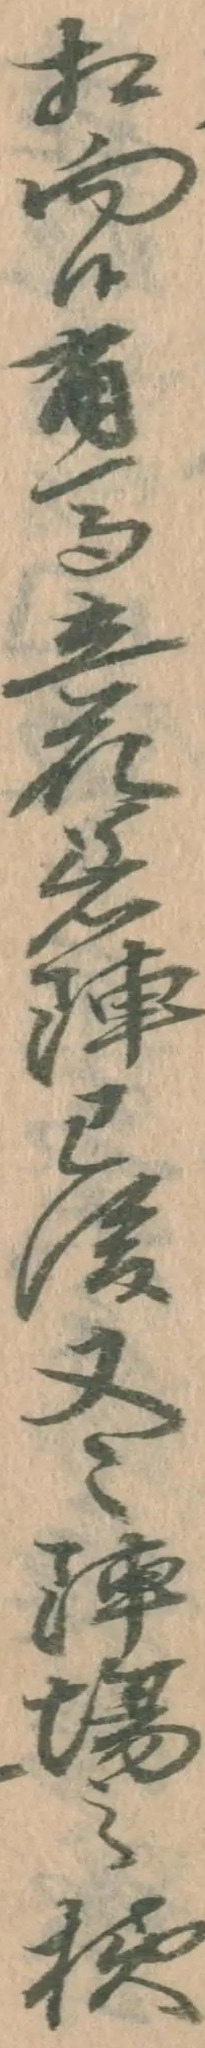相向候有馬立花着陣已後又々陣場之様
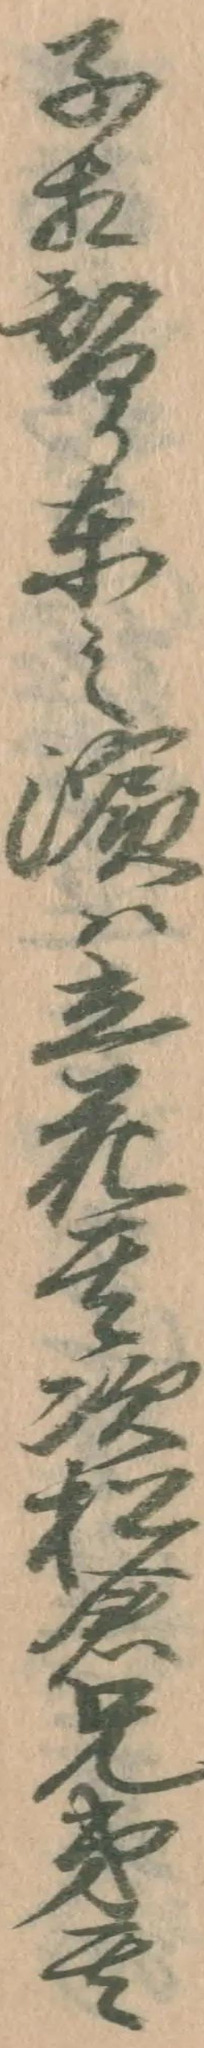子相替り東之浜は立花其次松倉兄弟其
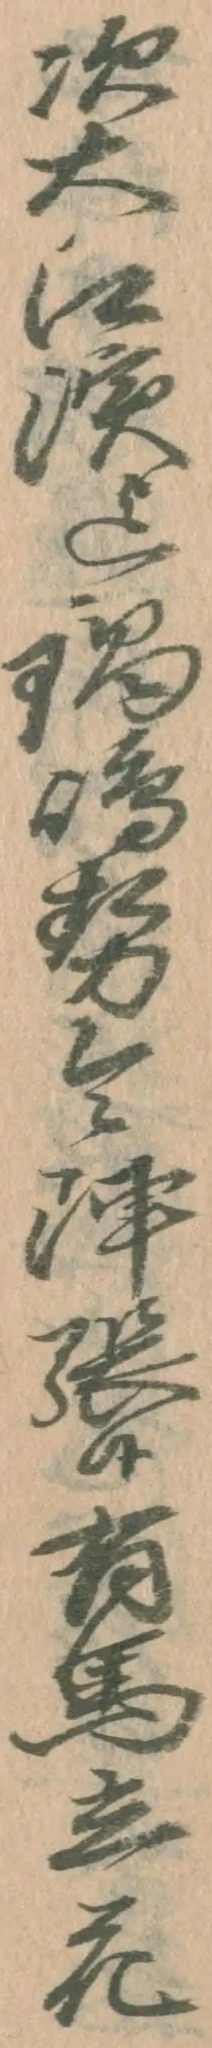次大江浜迄鍋島勢令陣張候有馬立花
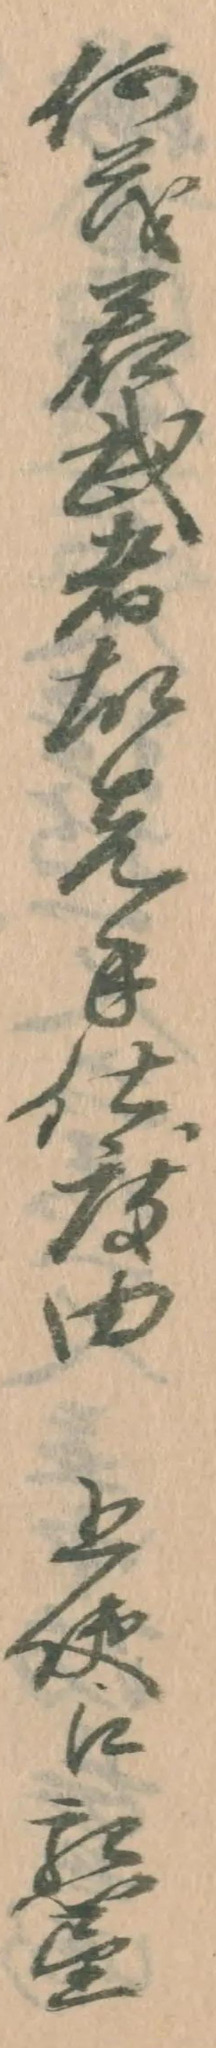何茂若武者故先手仕度由上使江懇望
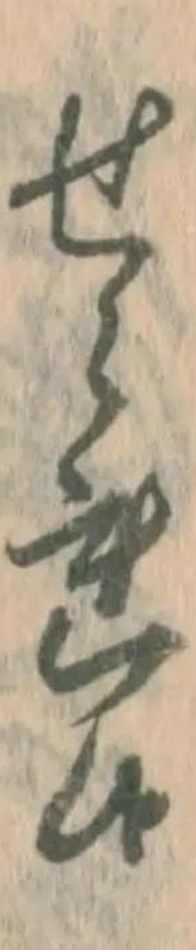せら連候
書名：切支丹御退治記 49巻. [4]
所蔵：国立国会図書館 National Diet Library, JAPAN
